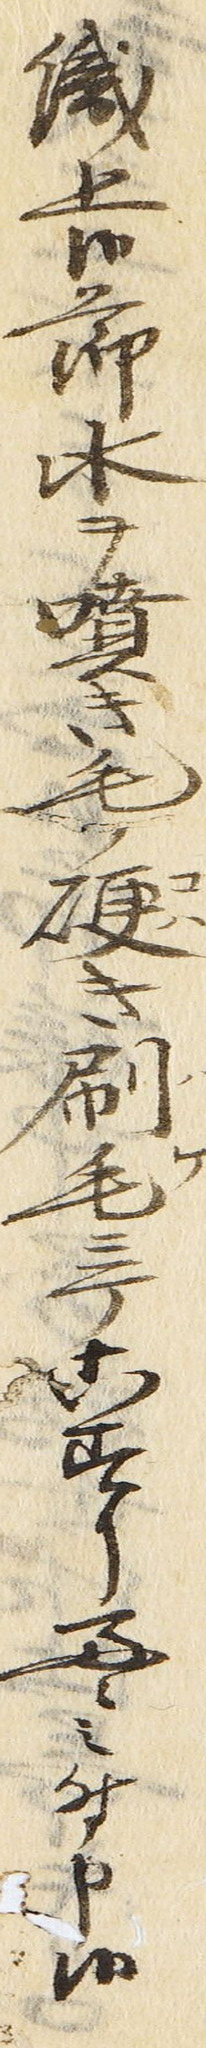織上候節水を噴き毛の硬き刷毛にてこすり畳み付申候
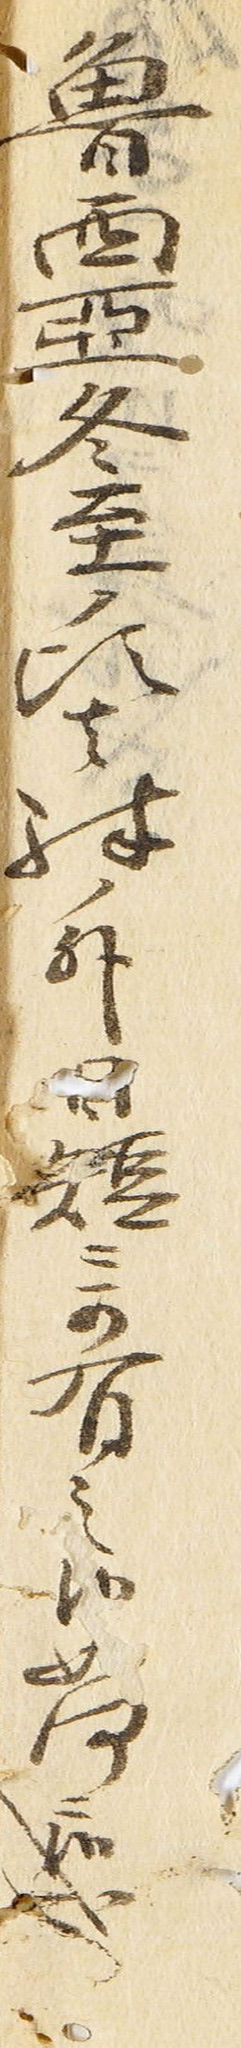魯西亜冬至の頃は殊の外日短に可有之候如何に候哉
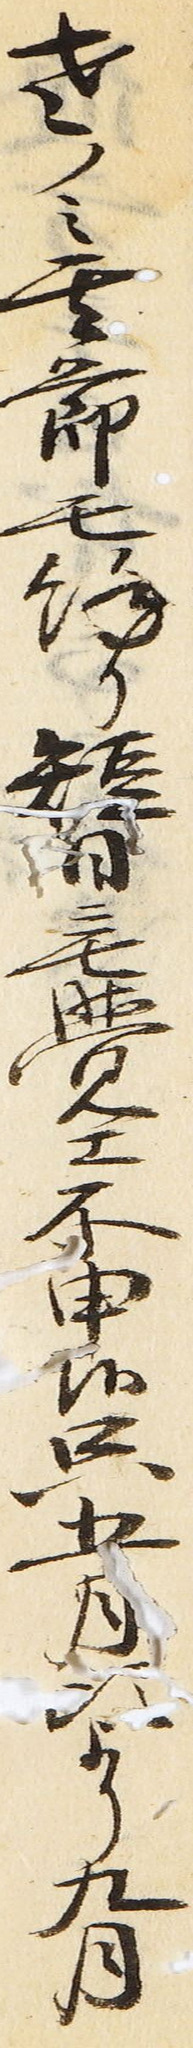さのみ其節も余り短日にも覚え不申候只五月頃より九月
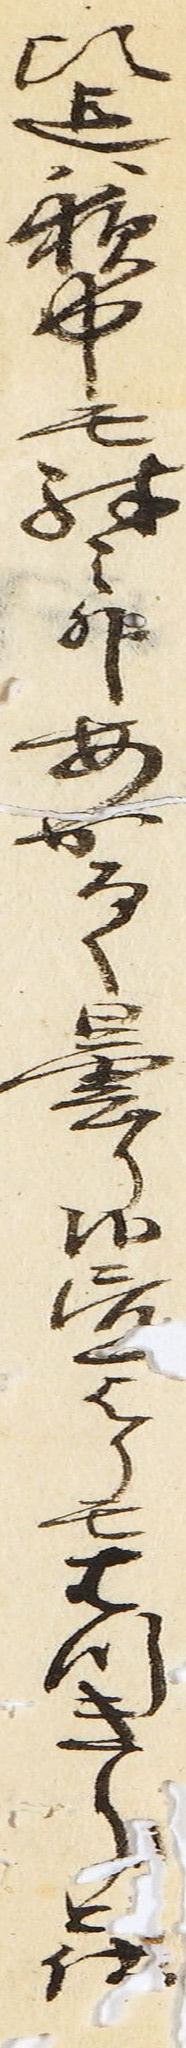頃迄は夜中も殊の外あかるく曇り候昼よりもはつきりと仕
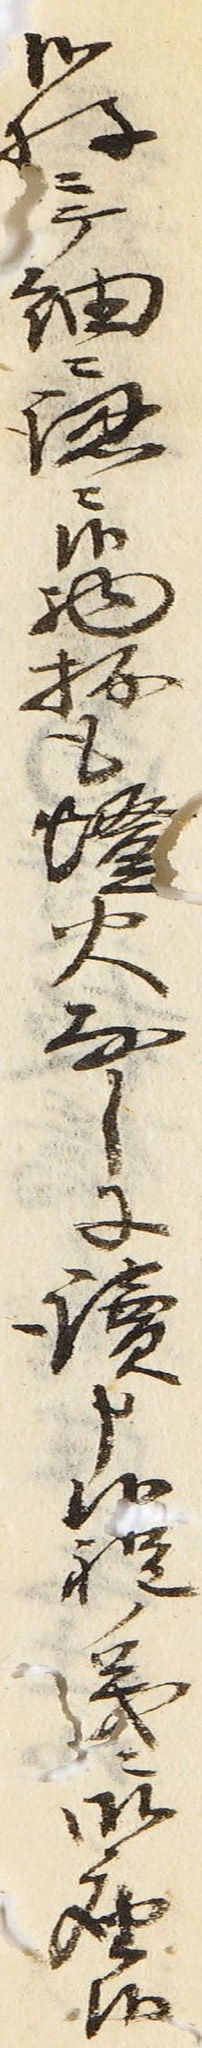候様にて細に認に候物抔も灯火なしに読申候程の義に御座候
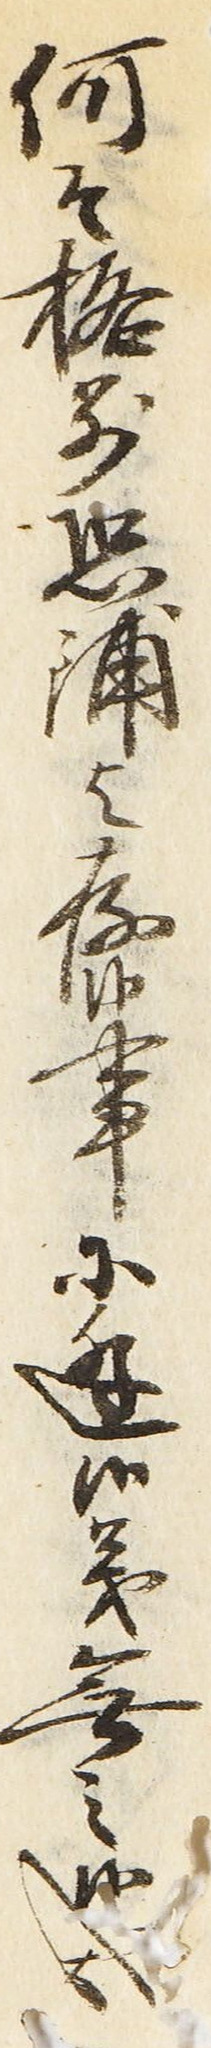何そ格別恐鋪と存候事に逢候義無之候哉
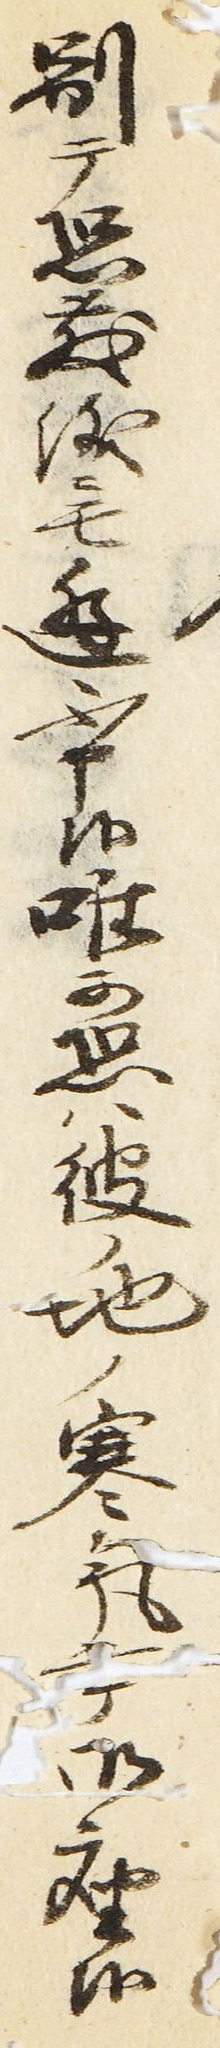別て恐敷儀にも逢不申候只可恐は彼の地の寒気にて御座候
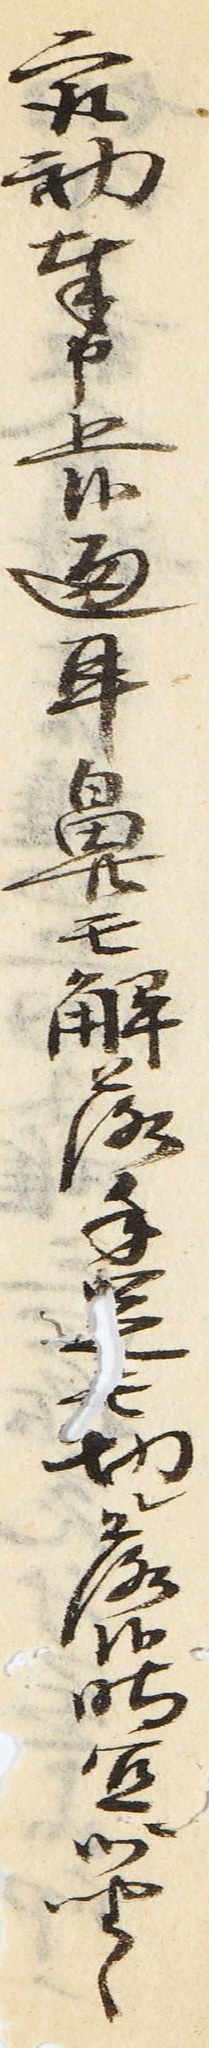最初奉申上候通耳鼻も解落手足も切れ落候時宜に御座候
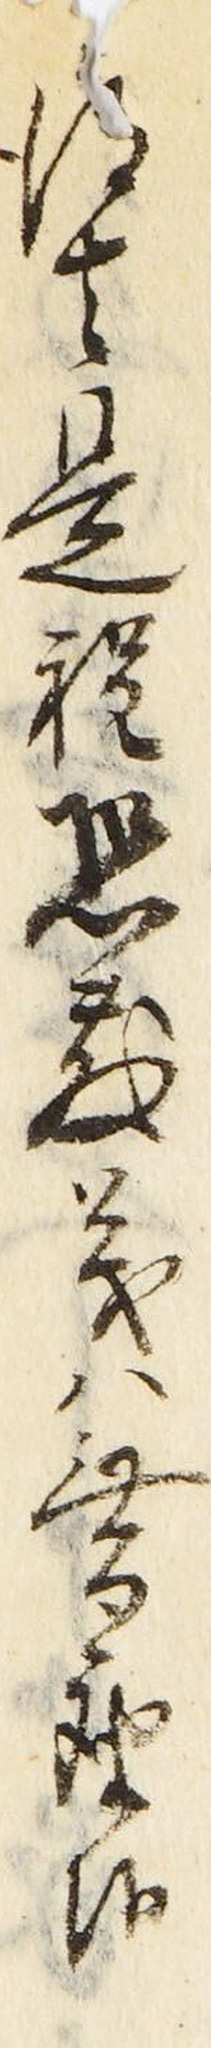得は是程恐敷義は無御座候
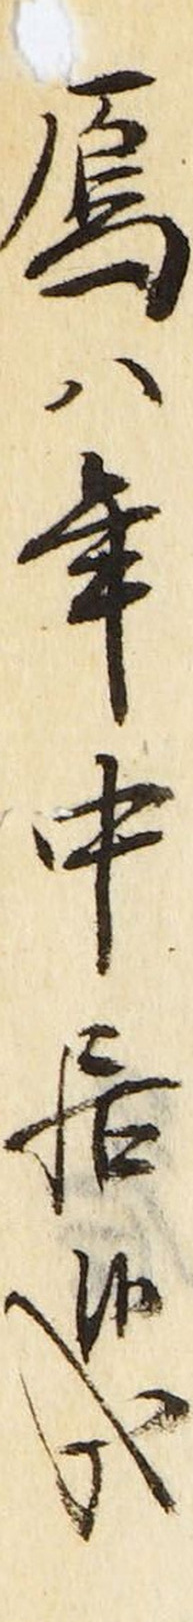雁は年中居候哉

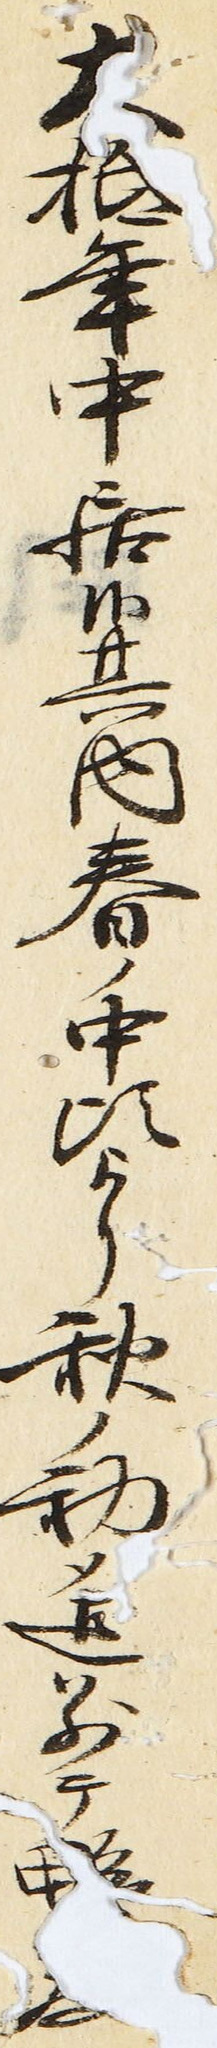大抵年中居候其内春の中頃より秋の初め迄別て鴨
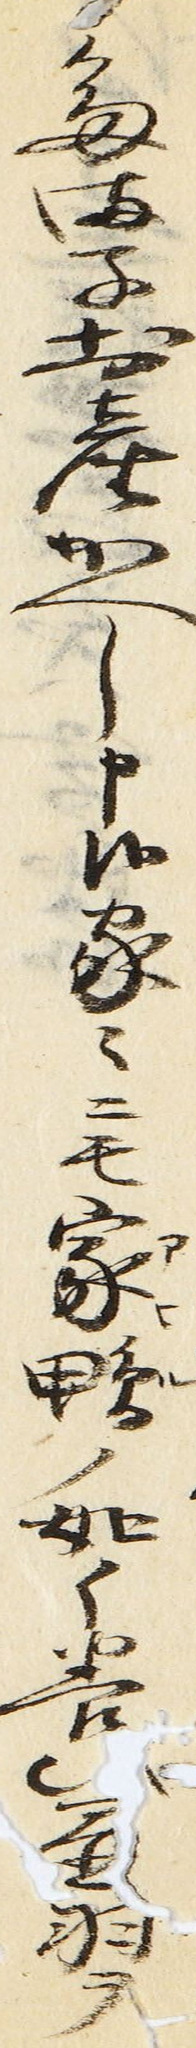かたま子お産かへし申候家々にも家鴨の如く養ひ置羽を
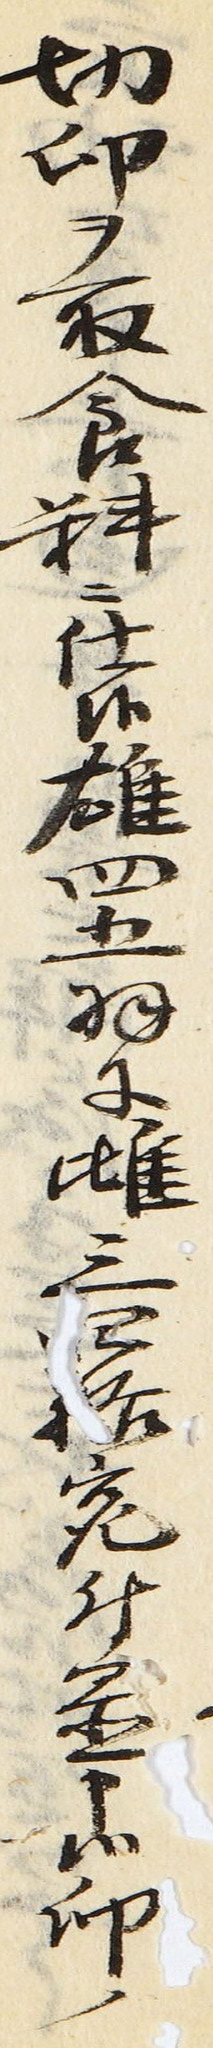切卵を取食料に仕候雄四五羽に雌三四拾宛付置申候卵の
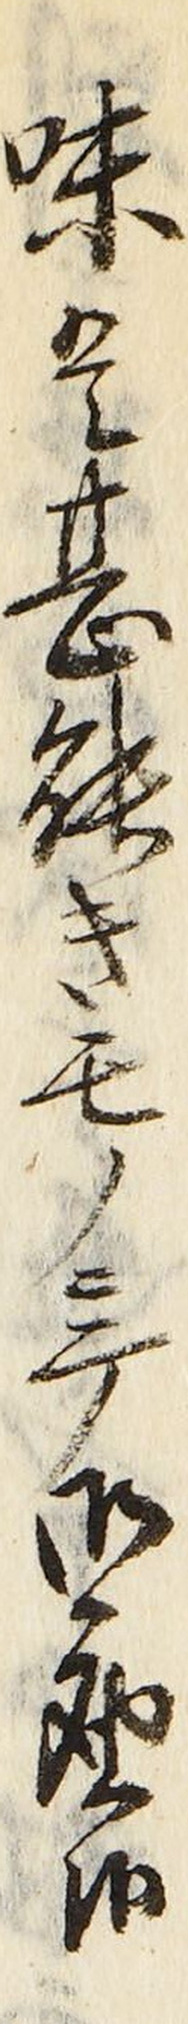味は甚能きものにて御座候
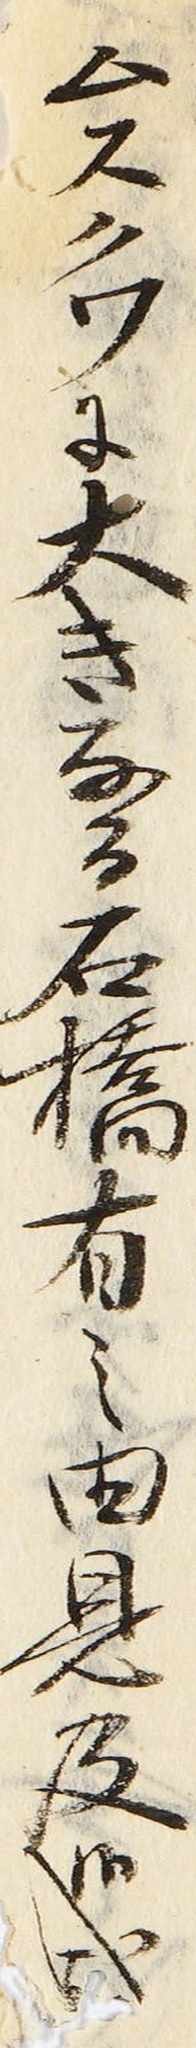ムスクワに大きなる石橋有之由見及候哉
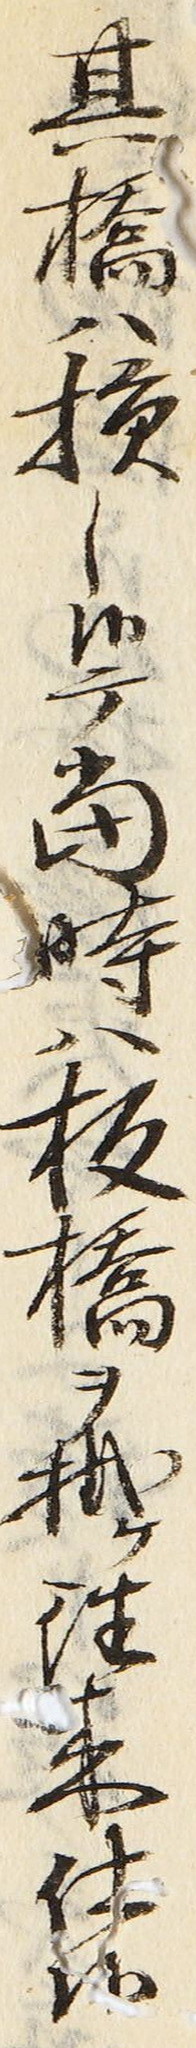其橋は損し候て当時は板橋を掛け往来仕候
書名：神昌丸漂流問答
